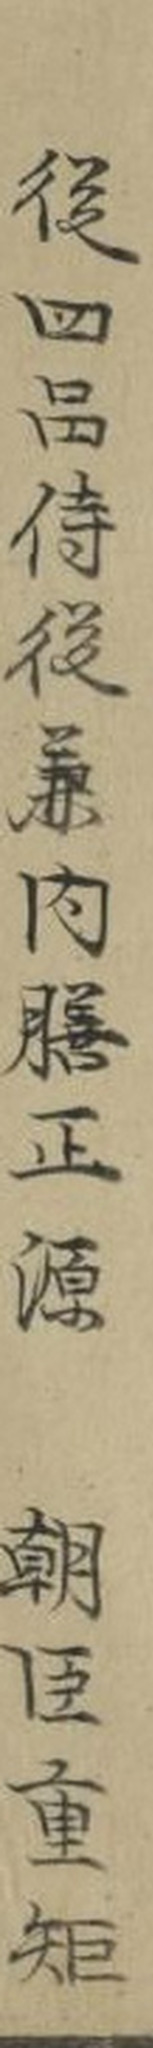従四品侍従兼内膳正源朝臣重矩

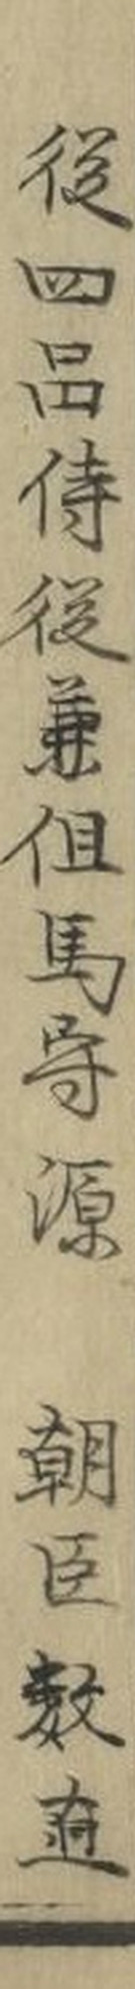従四品侍従兼但馬守源朝臣数
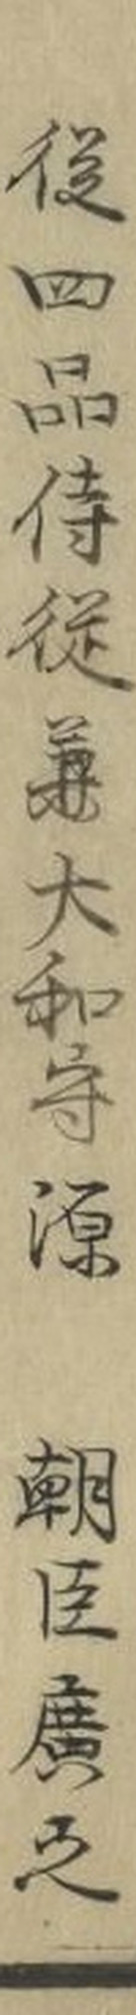従四品侍従兼大和守源朝臣廣之
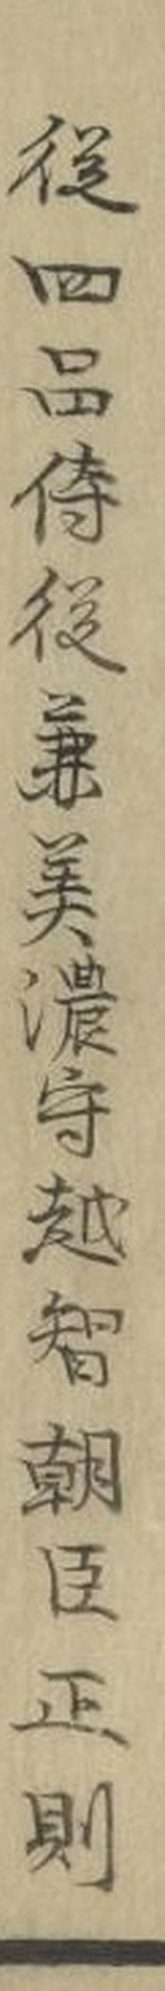従四品侍従兼美濃守越智朝臣正則
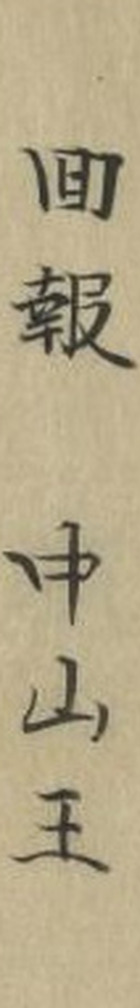回報中山王
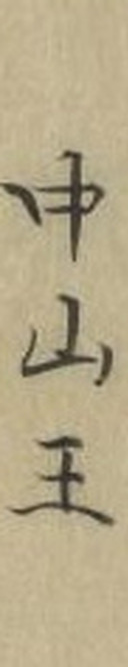中山王
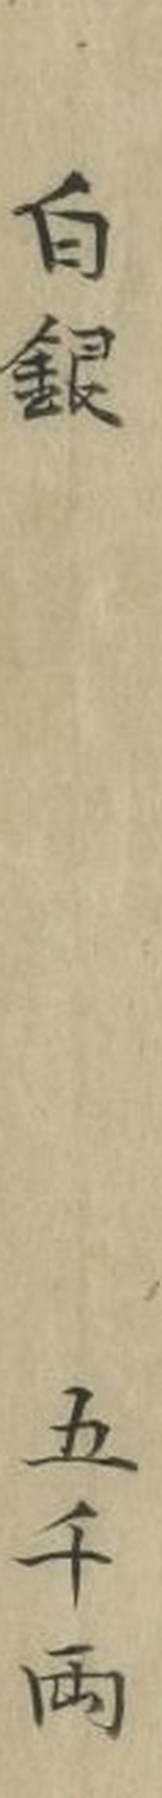白銀五千両
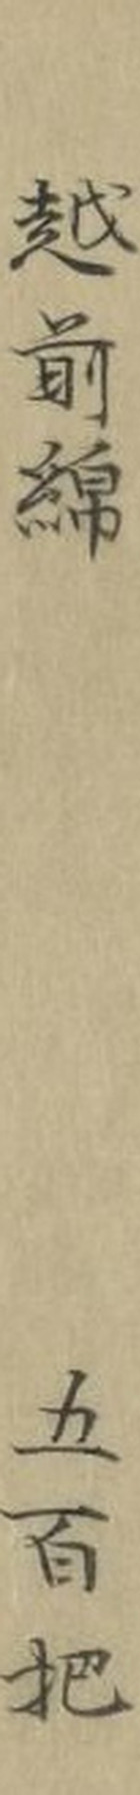越前綿五百把
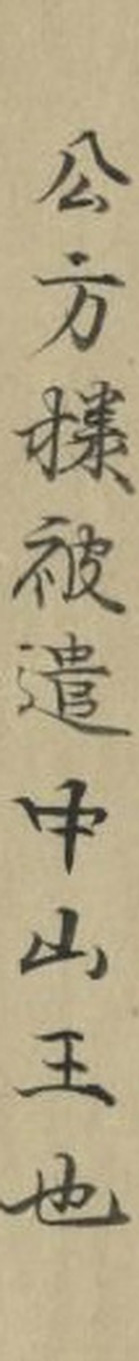公方様被遣中山王也
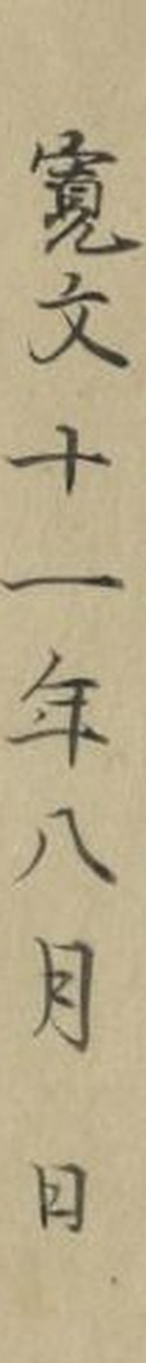寛文十一年八月日
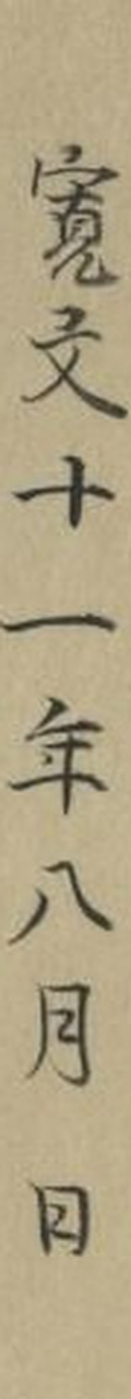寛文十一年八月日
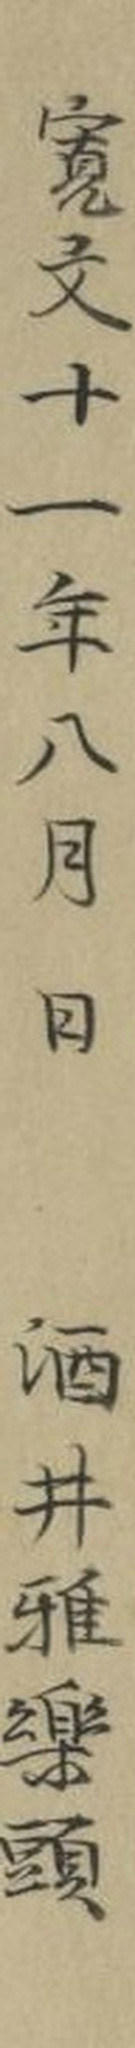寛文十一年八月日酒井雅楽頭
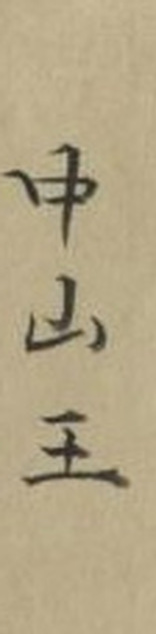中山王

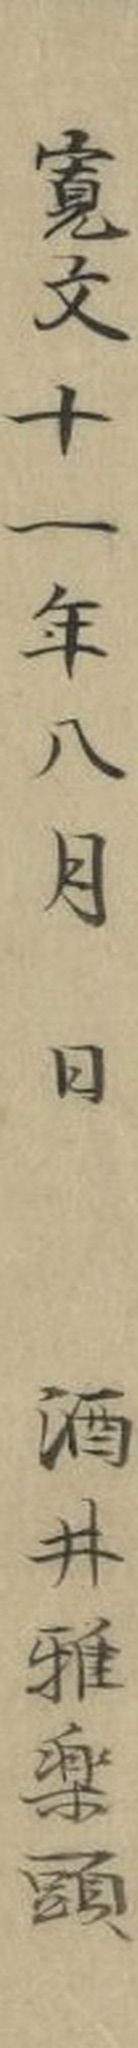寛文十一年八月日酒井雅楽頭
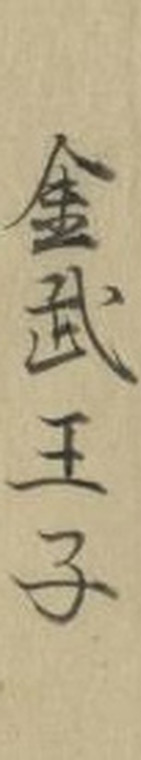金武王子
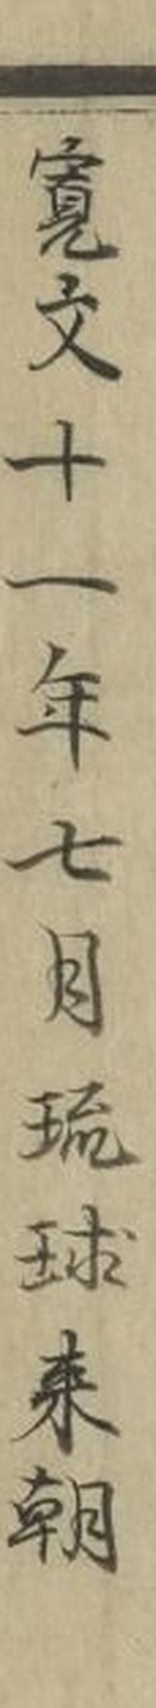寛文十一年七月琉球来朝
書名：琉球往来（下）
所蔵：University of the Ryukyus Library
